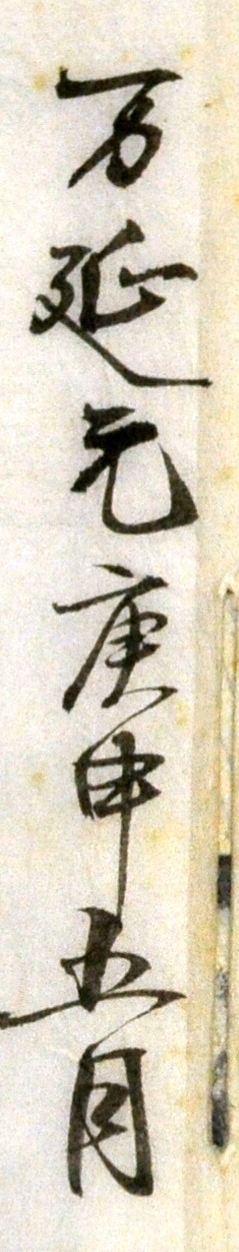万延元庚申五月
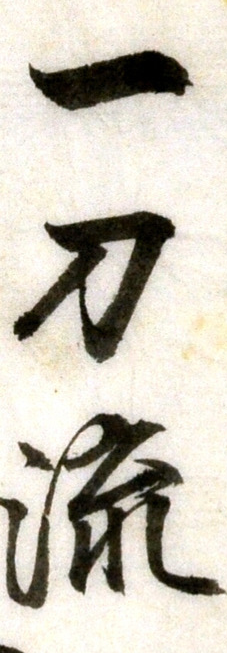一刀流
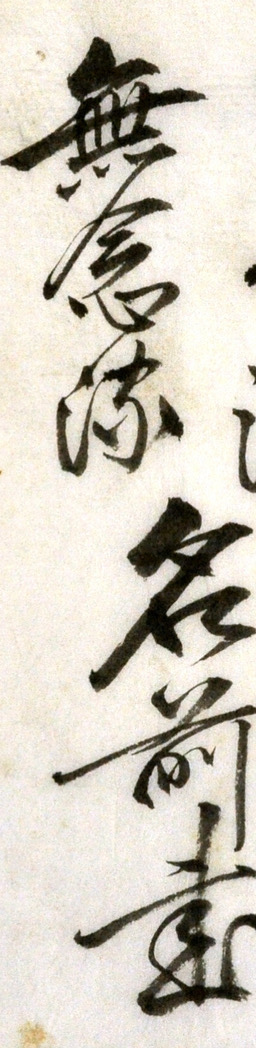無念流名前書
